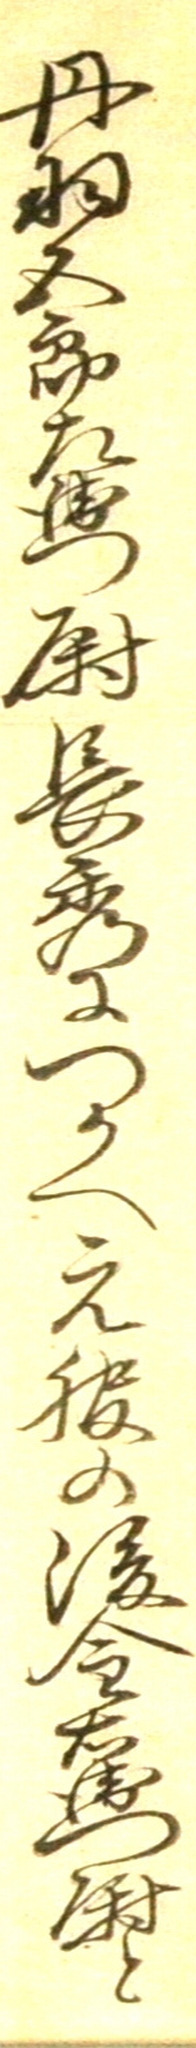丹羽五郎左衛門尉長秀につかへ元服の後金右衛門尉と
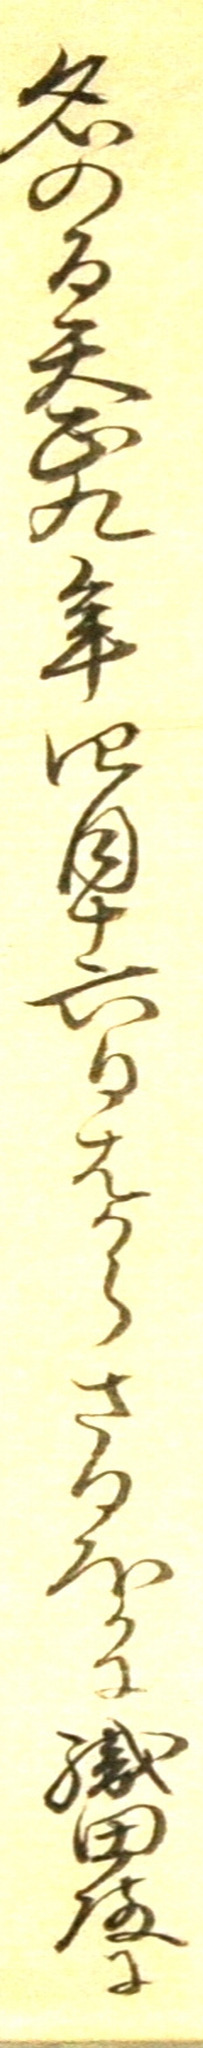名のる天正九年四月十六日はからさるほかに織田殿に
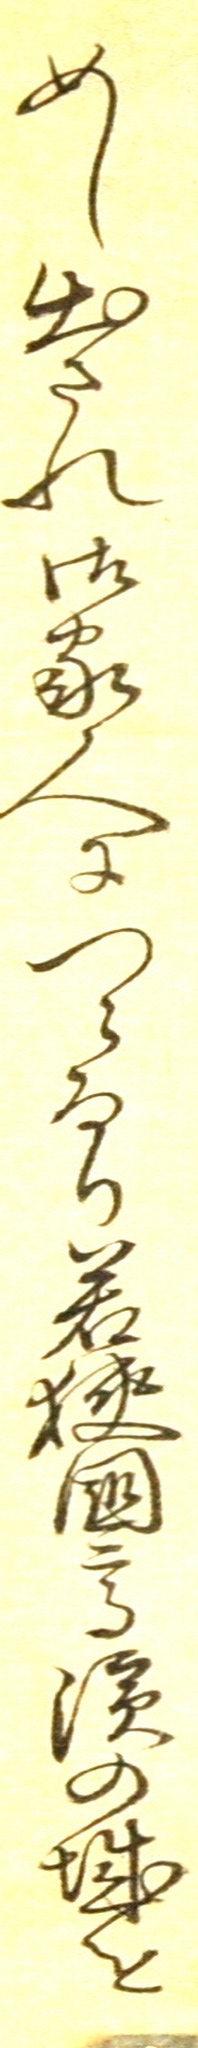めし出され御家人につらなり若狭国高浜の城を

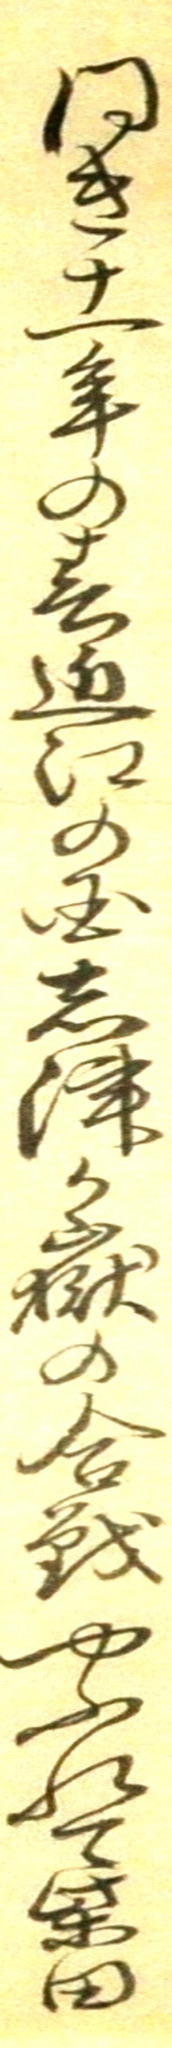同き十一年の春近江の国志津か嶽の合戦やふれて柴田
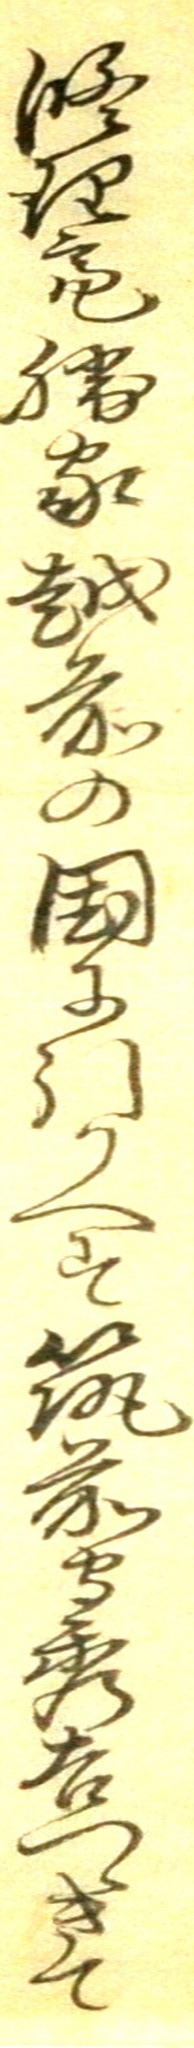修理亮勝家越前の国に引かへす筑前守秀吉つゝきて
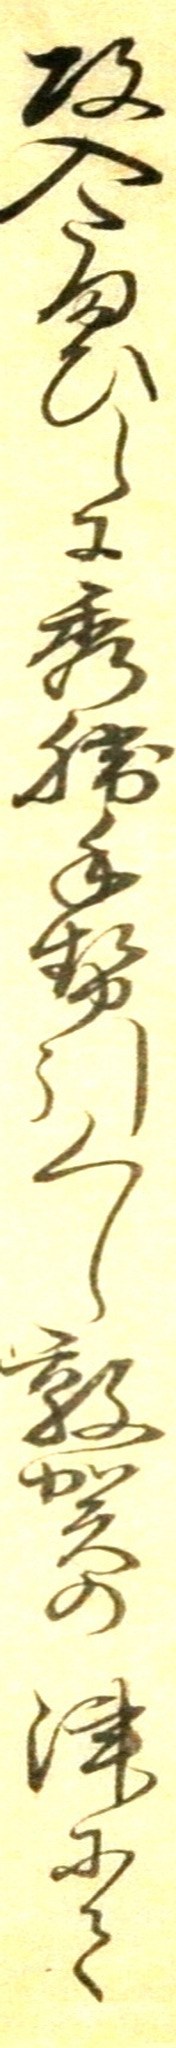攻入たまひしに秀勝手勢引くし敦賀の津にて
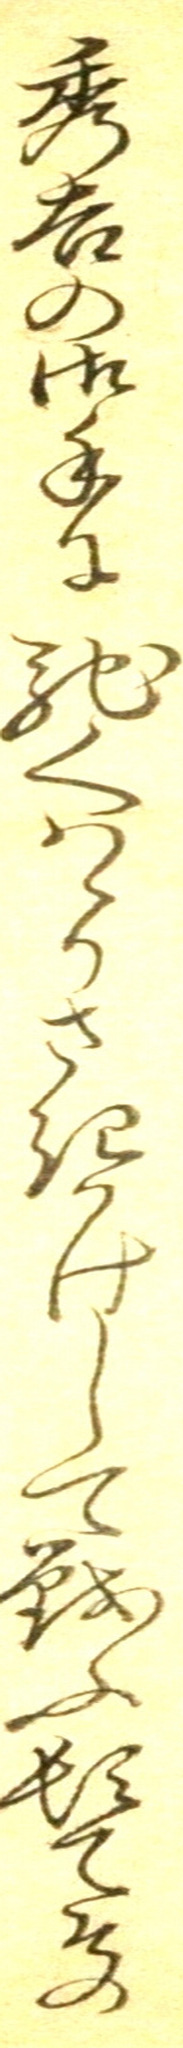秀吉の御手に馳くはゝりさきかけして戦ふ頓てその
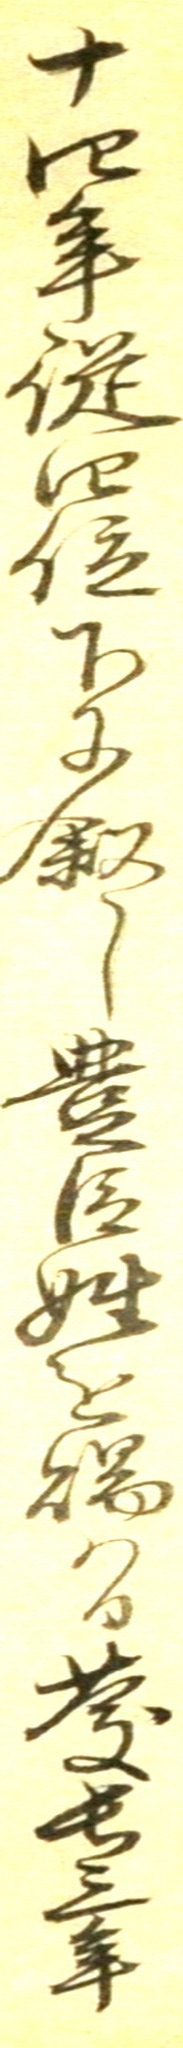十四年従四位下に叙し豊臣姓を賜はる慶長三年
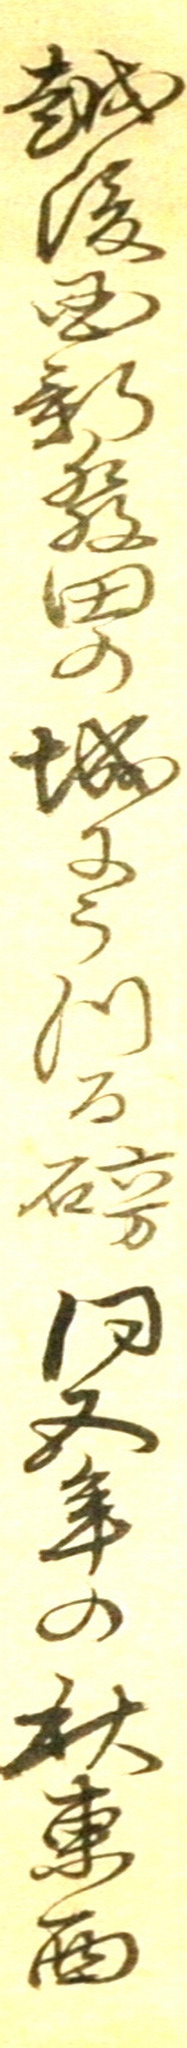越後国新発田の城にうつる六万石同五年の秋東西
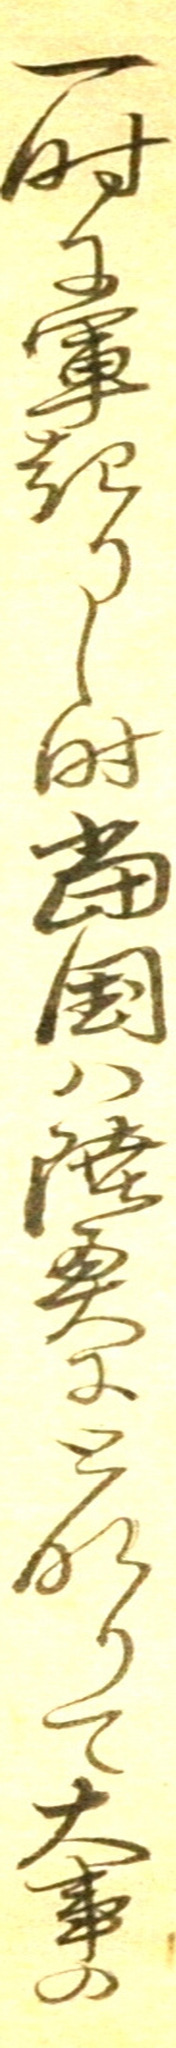一時に軍起りし時当国は陸奥にとなりて大事の
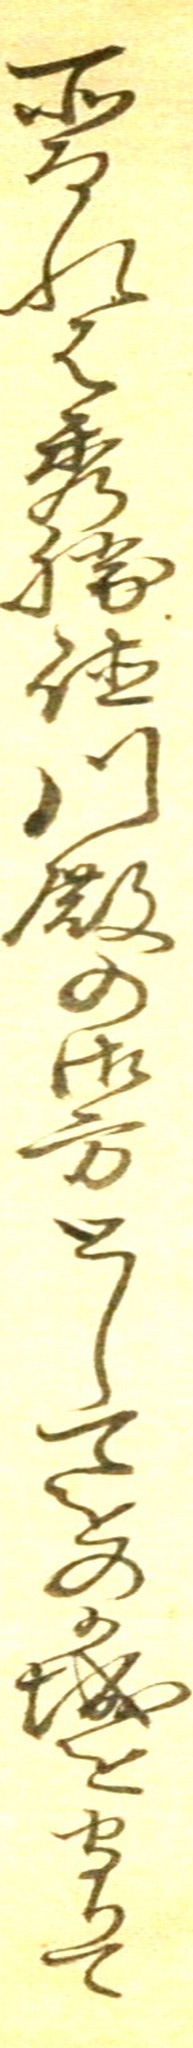所なれは秀勝徳川殿の御方としてをのか城を守りて
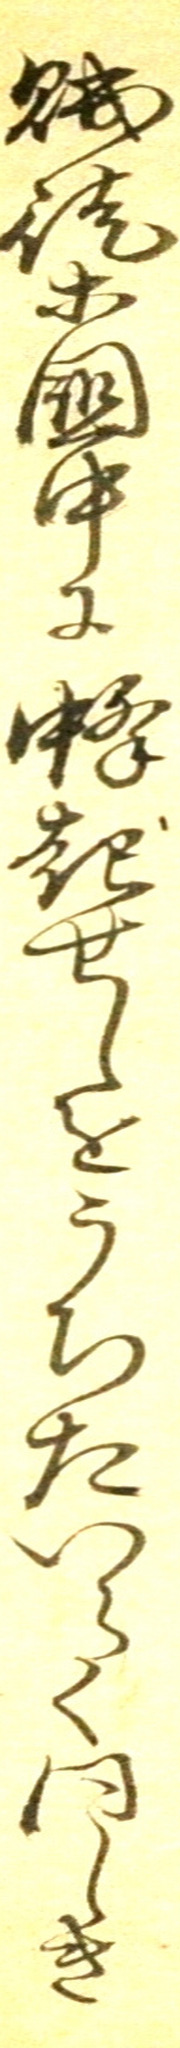賊徒等国中に蜂起せしをうちたいらく同しき
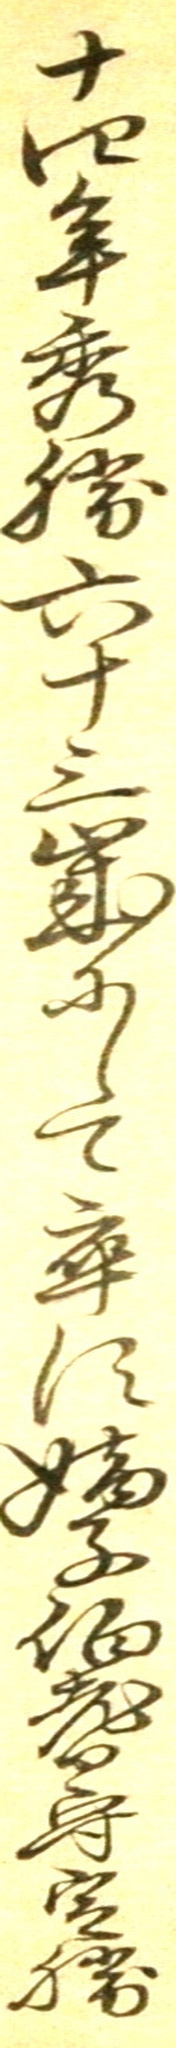十四年秀勝六十三歳にして卒す嫡子伯耆守定勝
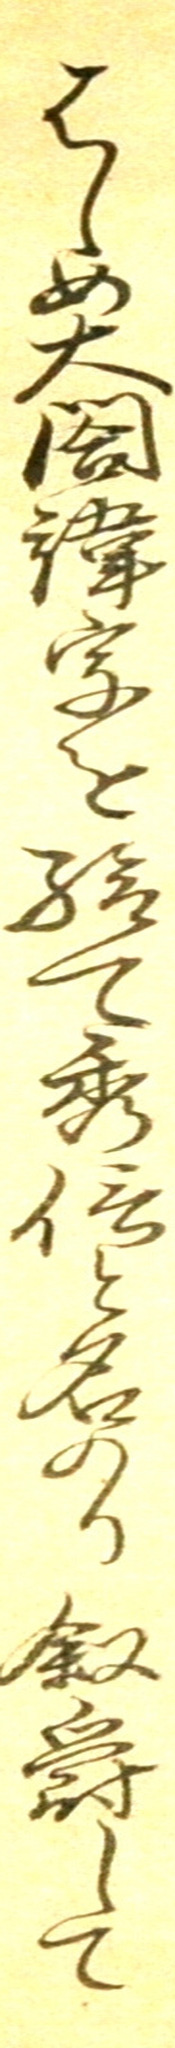はしめ大閤諱字を給て秀信と名のり叙爵して
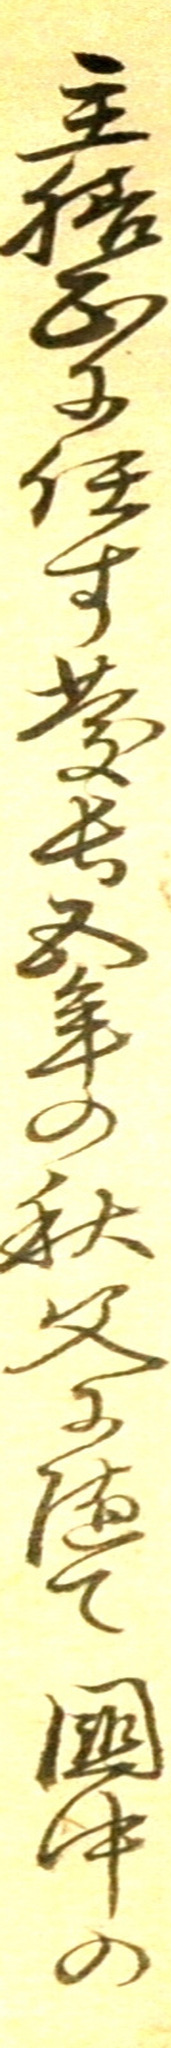主膳正に任す慶長五年の秋父に随て国中の

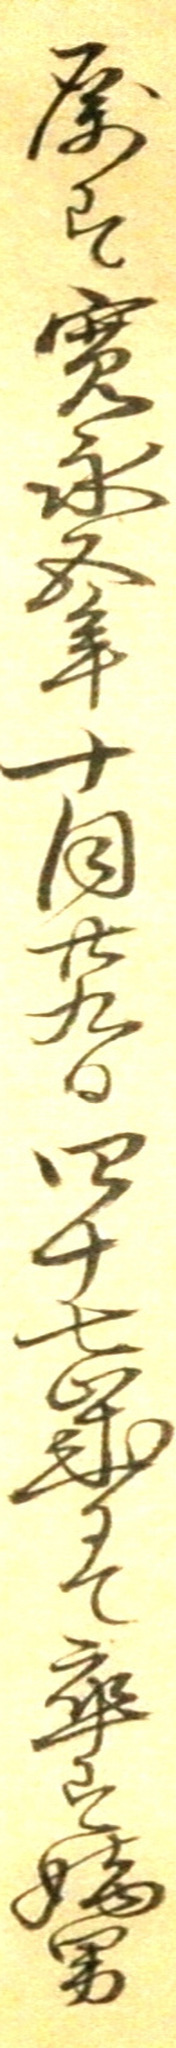属す寛永五年十月廿九日四十七歳にて卒す嫡男
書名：藩翰譜（九・上）
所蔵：伊那市立高遠町図書館・合同会社AMANE
